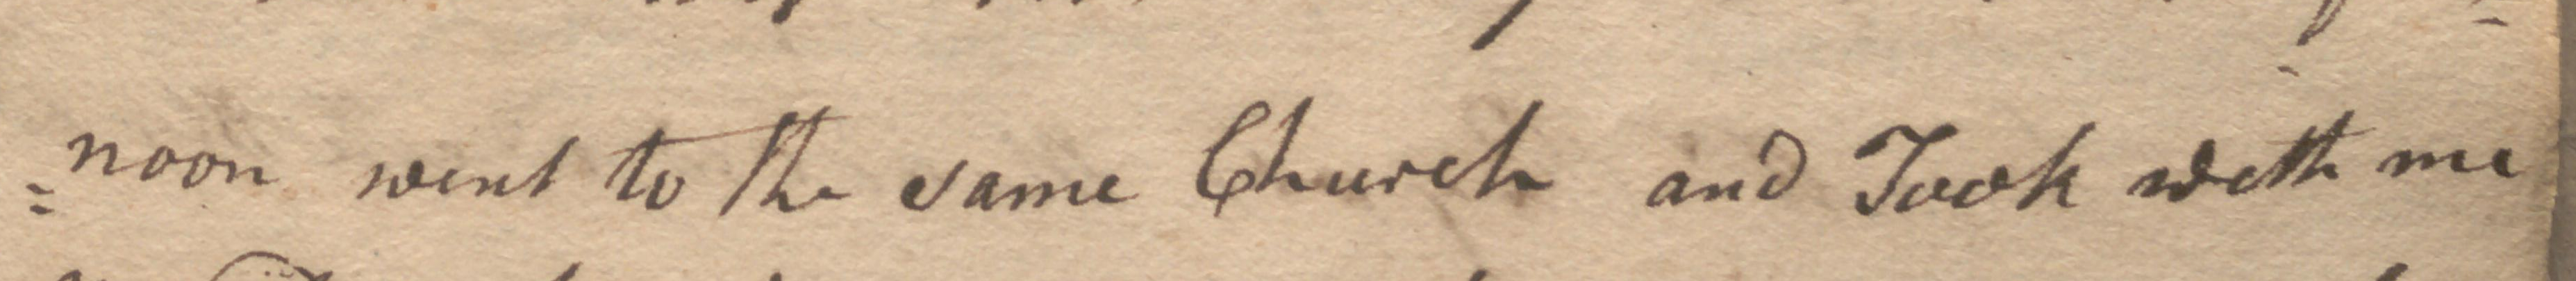noon went to the same Church and Took with me
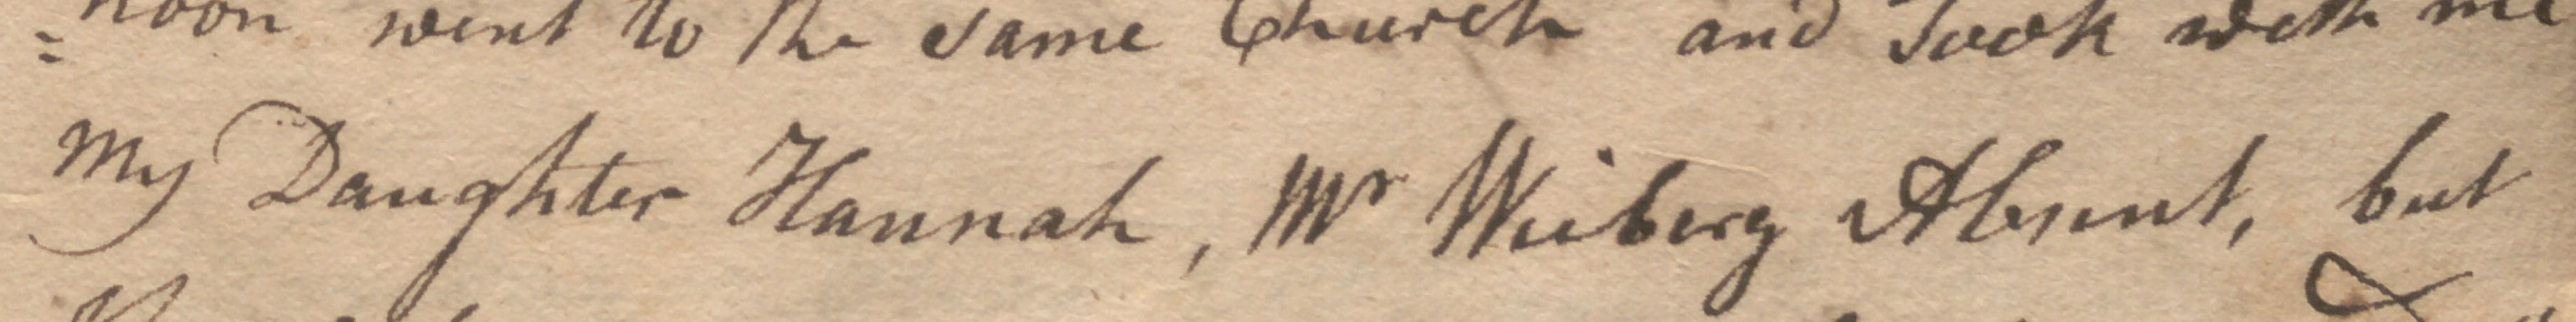My Daughter Hannah M^r. Weiberg Absent, but
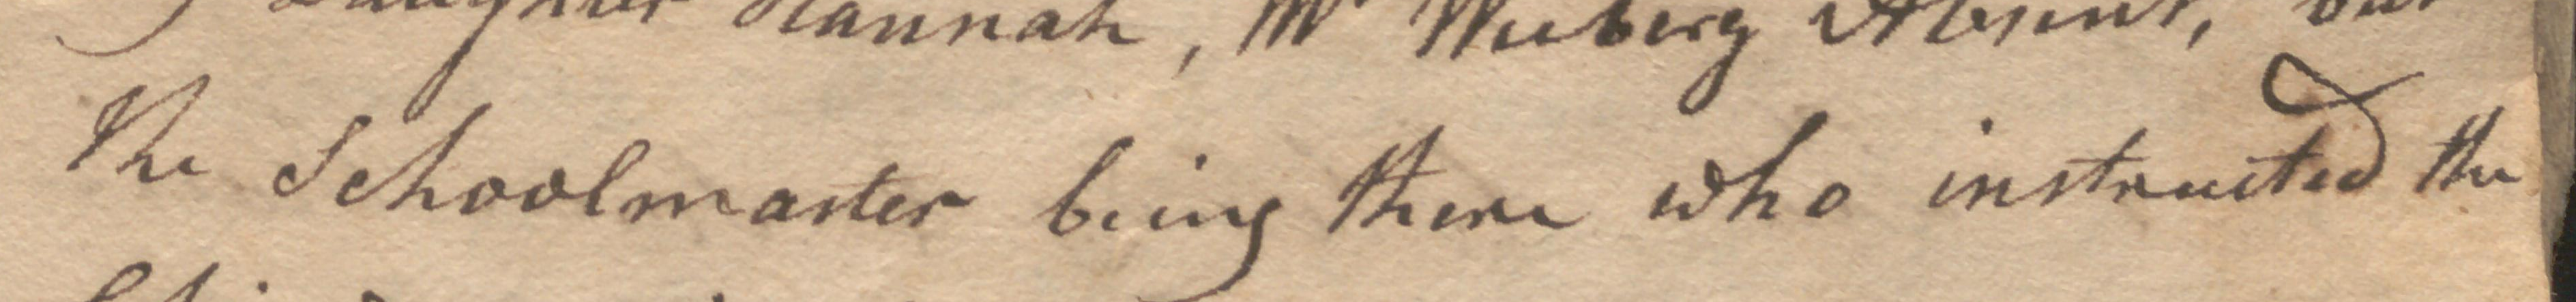the Schoolmaster being there who instructed the
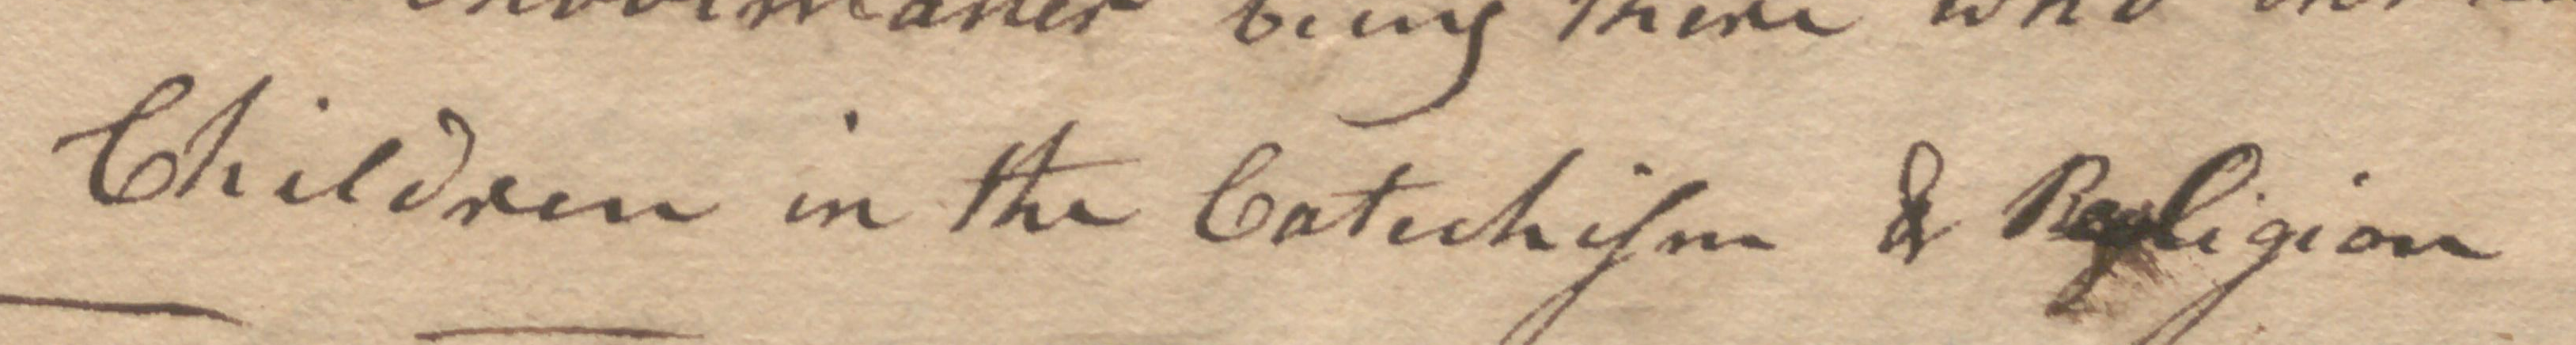Children in the Catechism & Religion
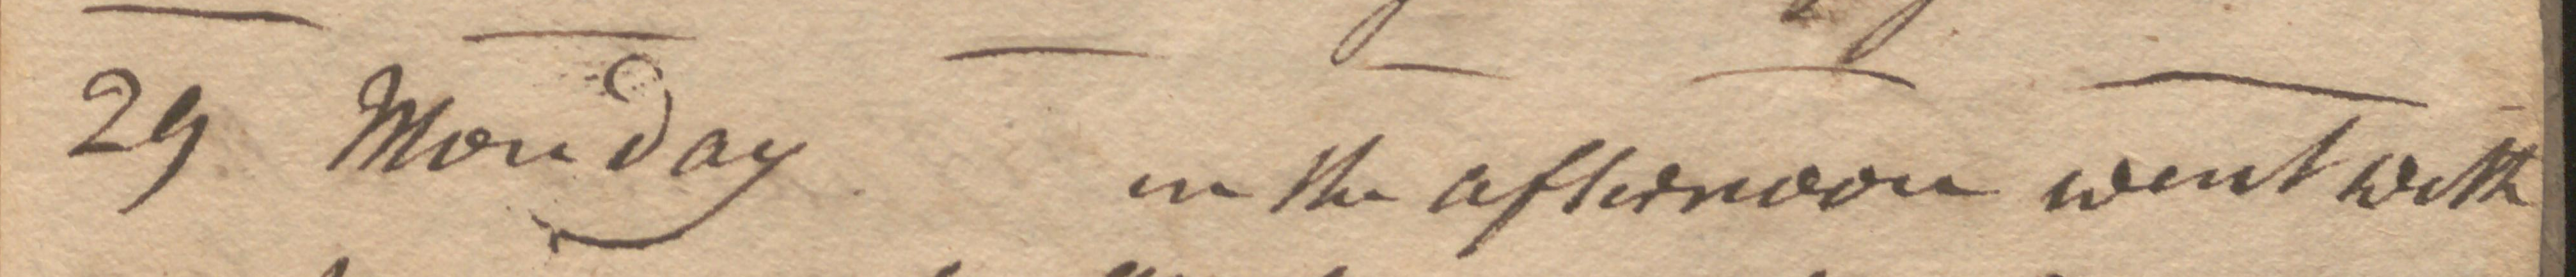29 Monday- in the afternoon went with
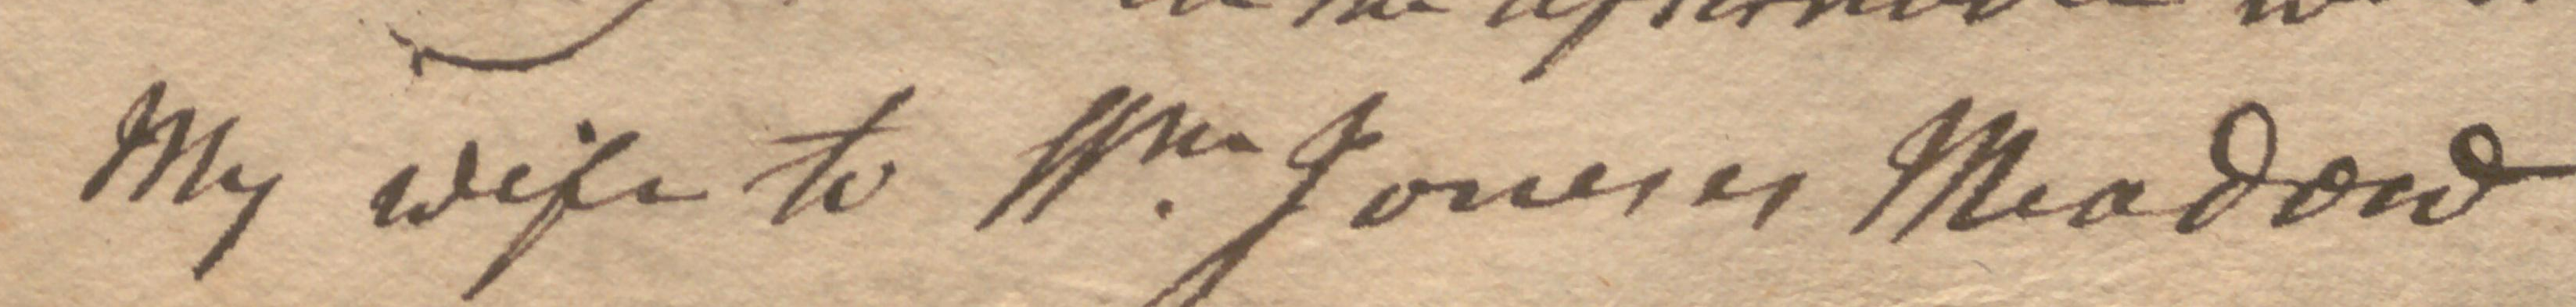My wife to W^m. Joneses Meadow
